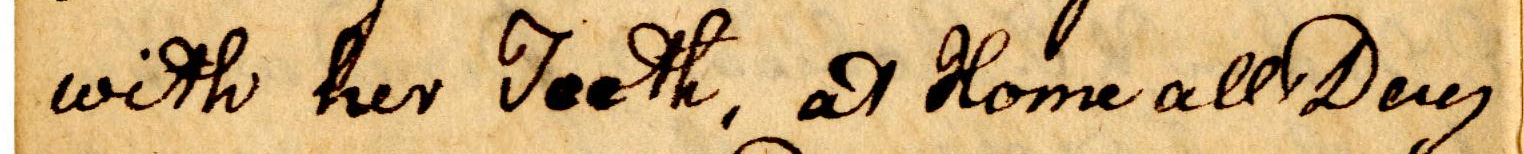with her Tooth, at Home all Day
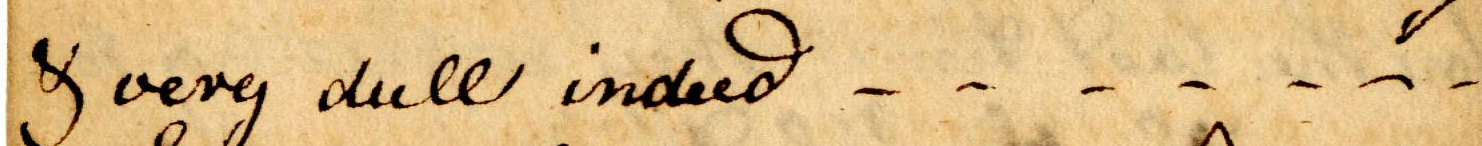& very dull indeed--
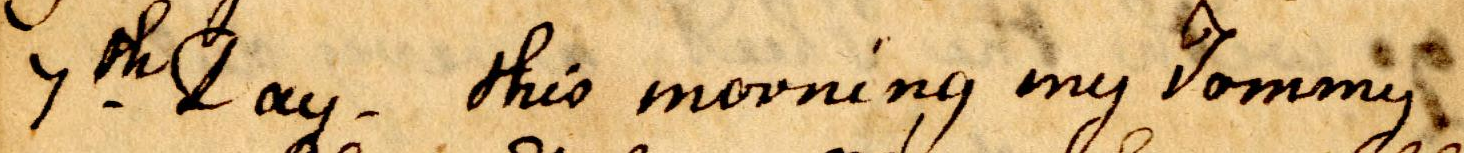7^th Day. this morning my Tommy
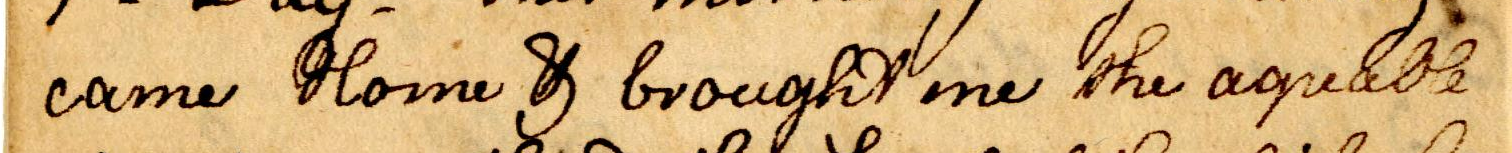came Home & brought me the agreabe
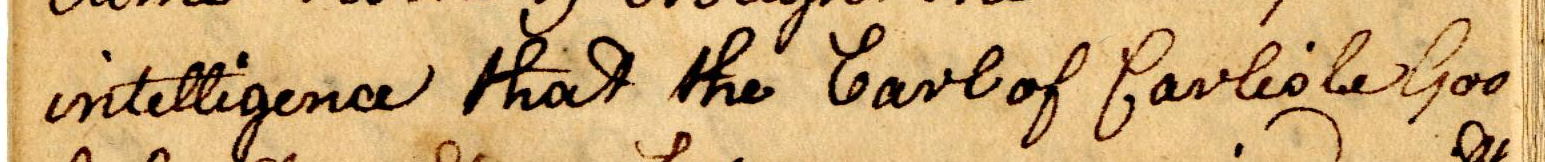intelligence that the Earl of Carlisle Goo
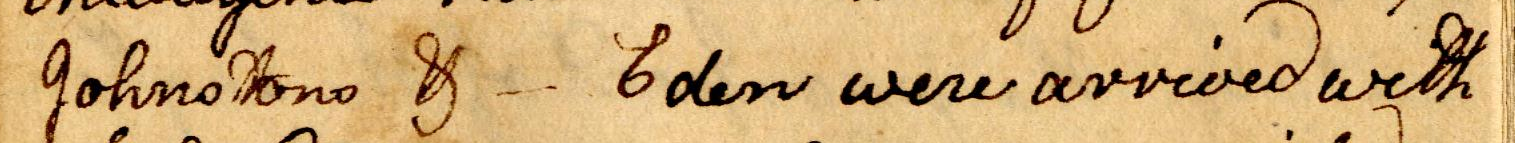Johnstons &- Eden were arrived with
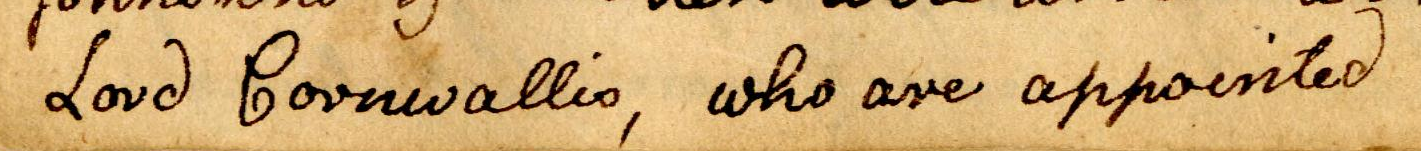Lord Cornwallis, who are appointed
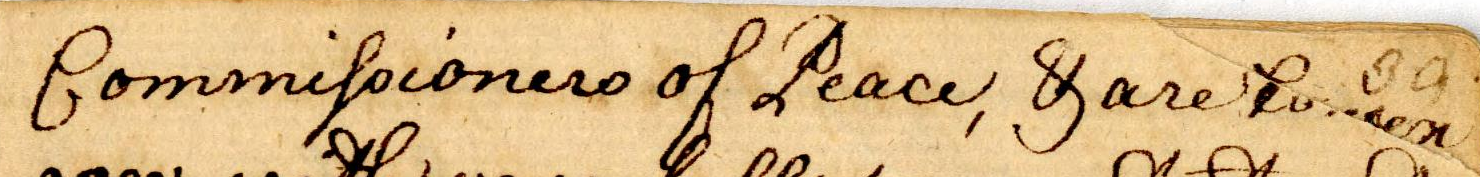Commissioners of Peace, & are [____]
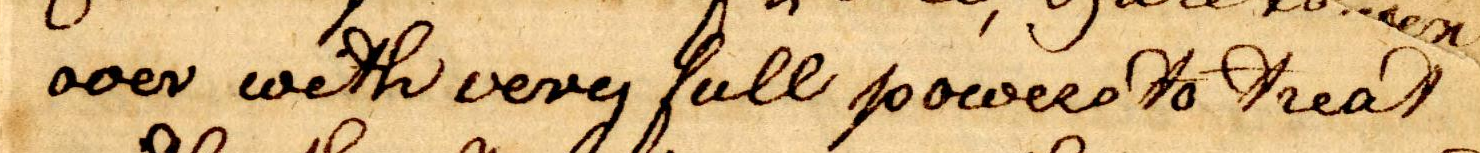over with very full powers to treat
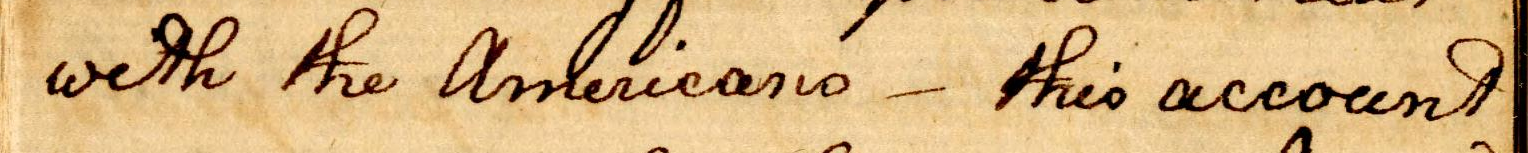with the Americans- this account
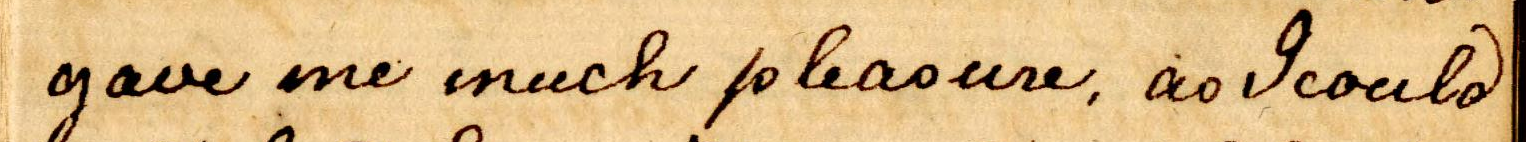gave me much pleasure, as I could
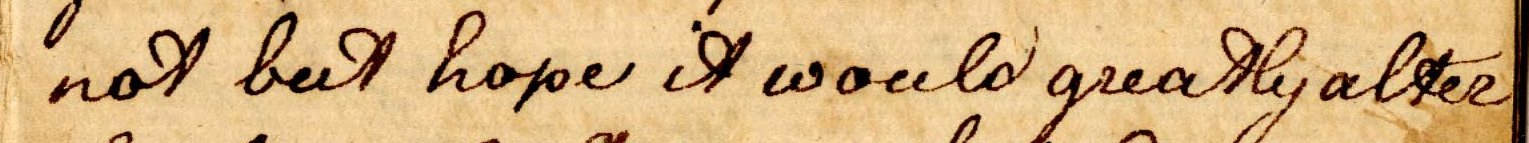not but hope it would greatly alter
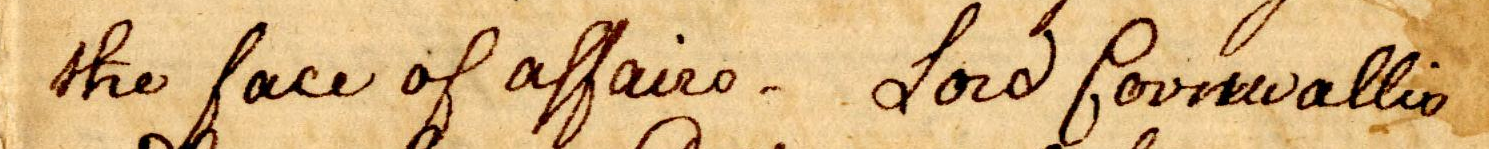the face of affairs. Lord Cornwallis
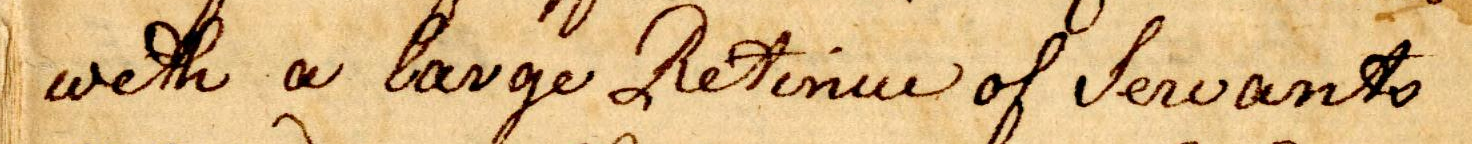with a large Retinue of Servants
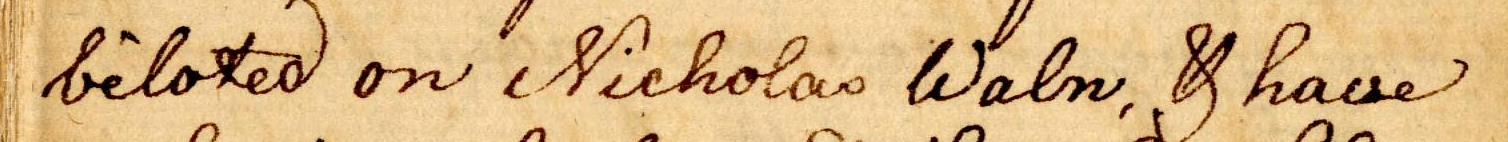biloted on Nicholas Waln, & have
